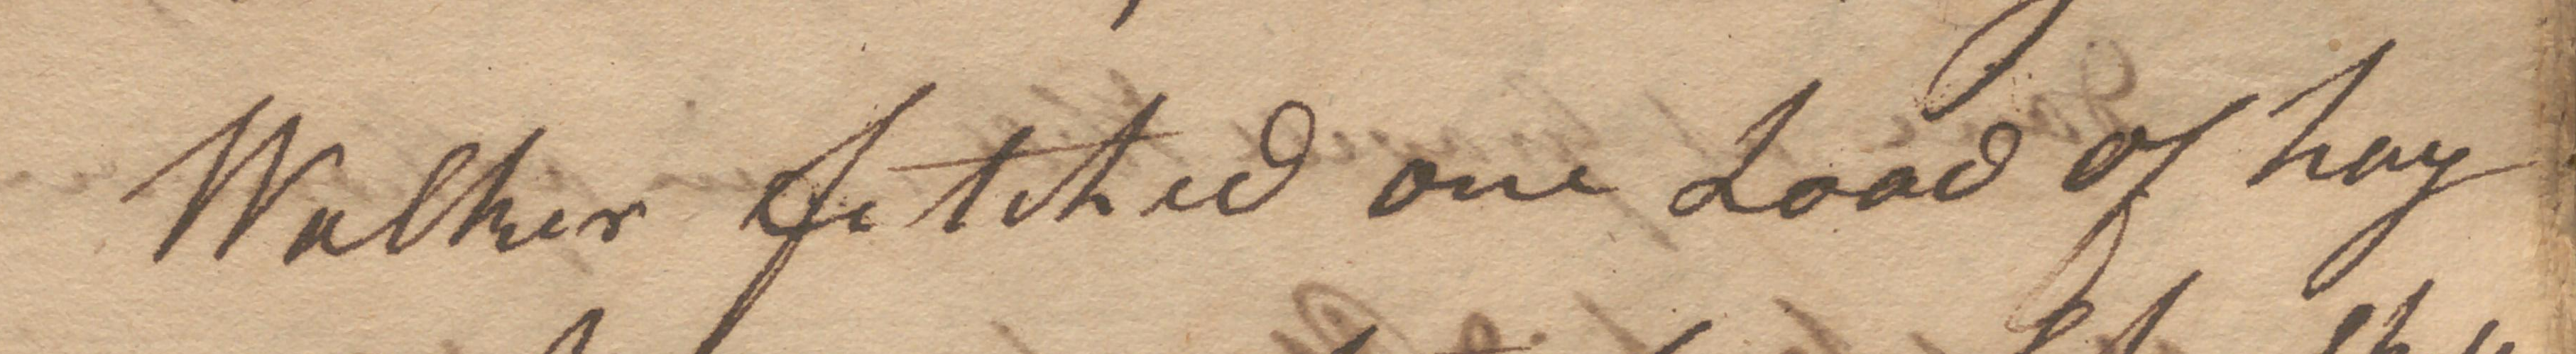Walker fetched one Load of hay
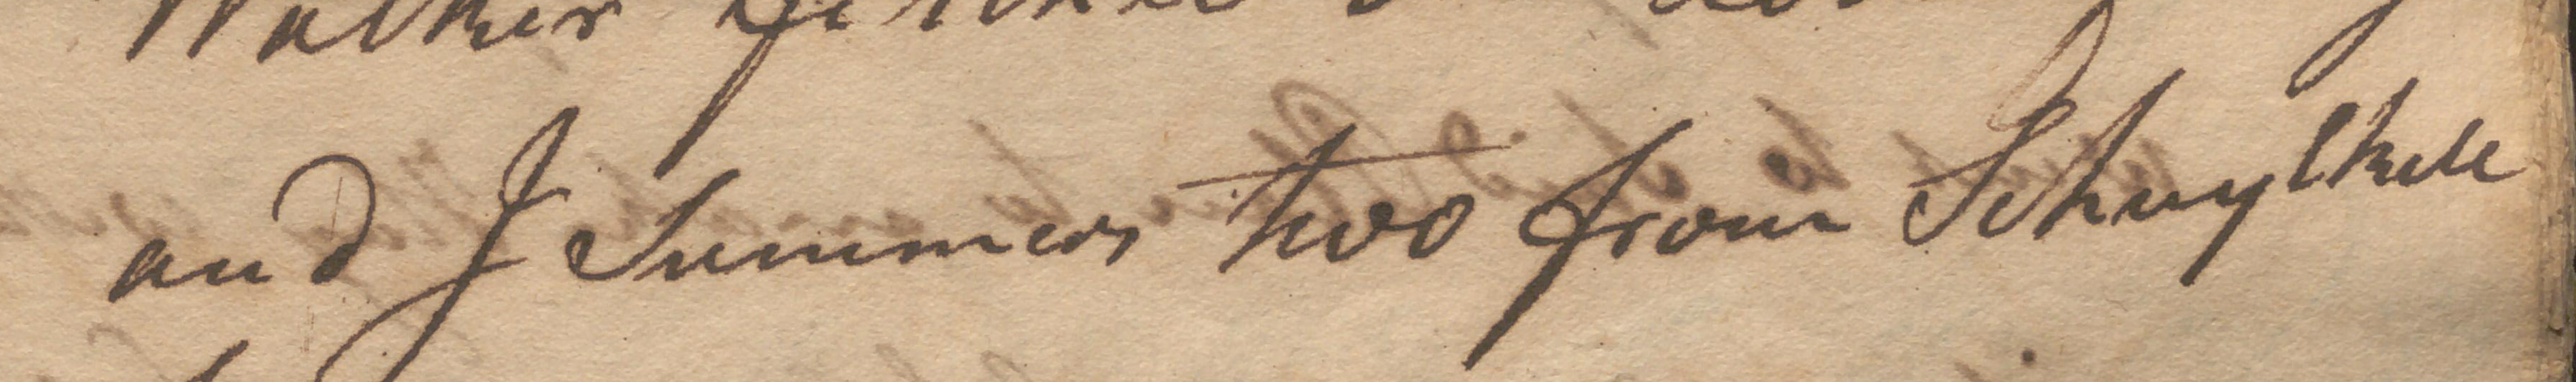and J Summers two from Schuylkill
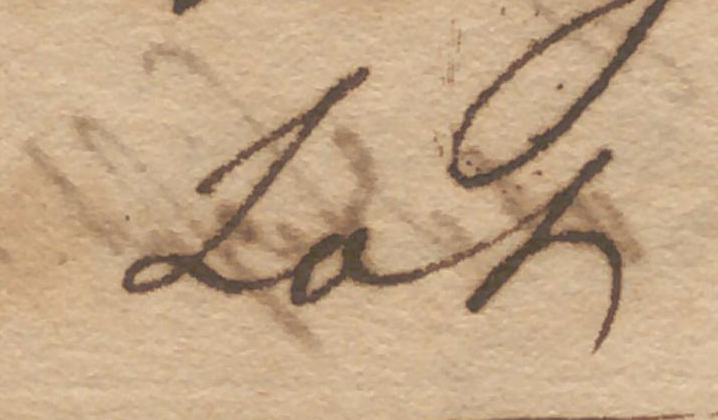Lot
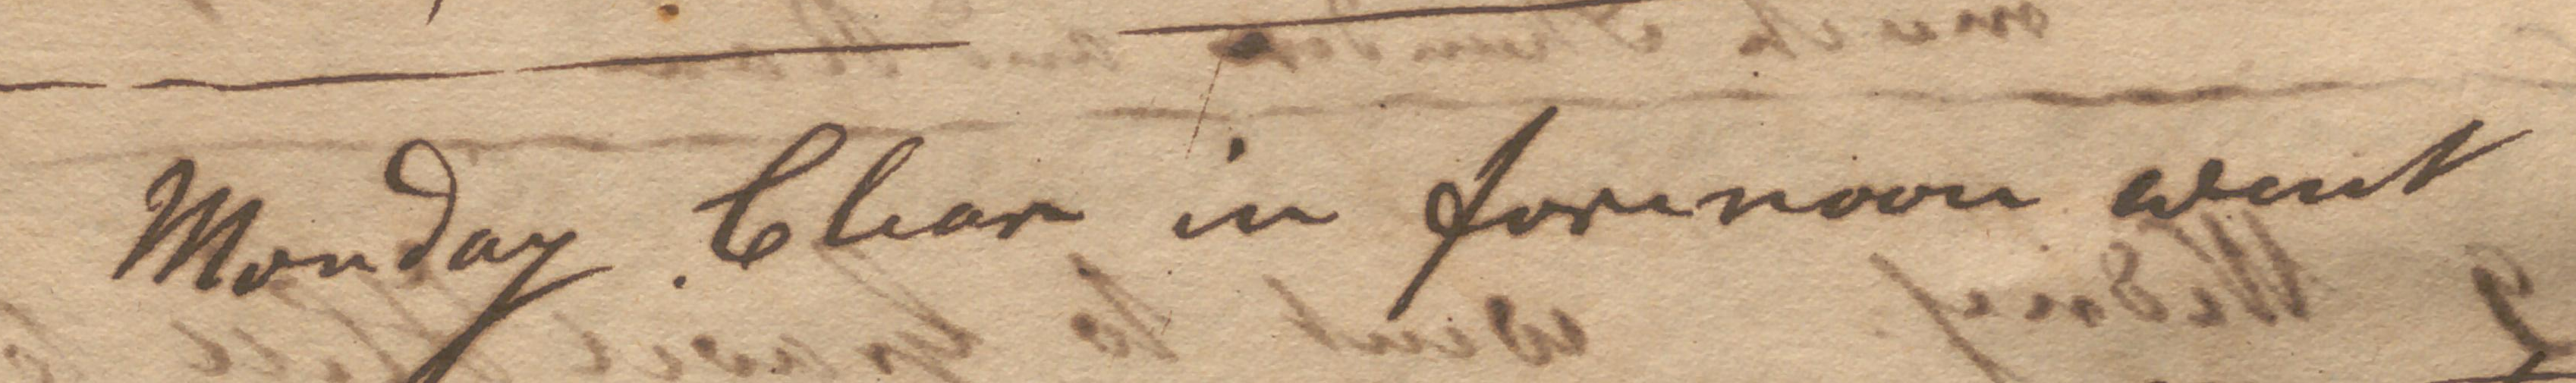Monday Clear in forenoon went
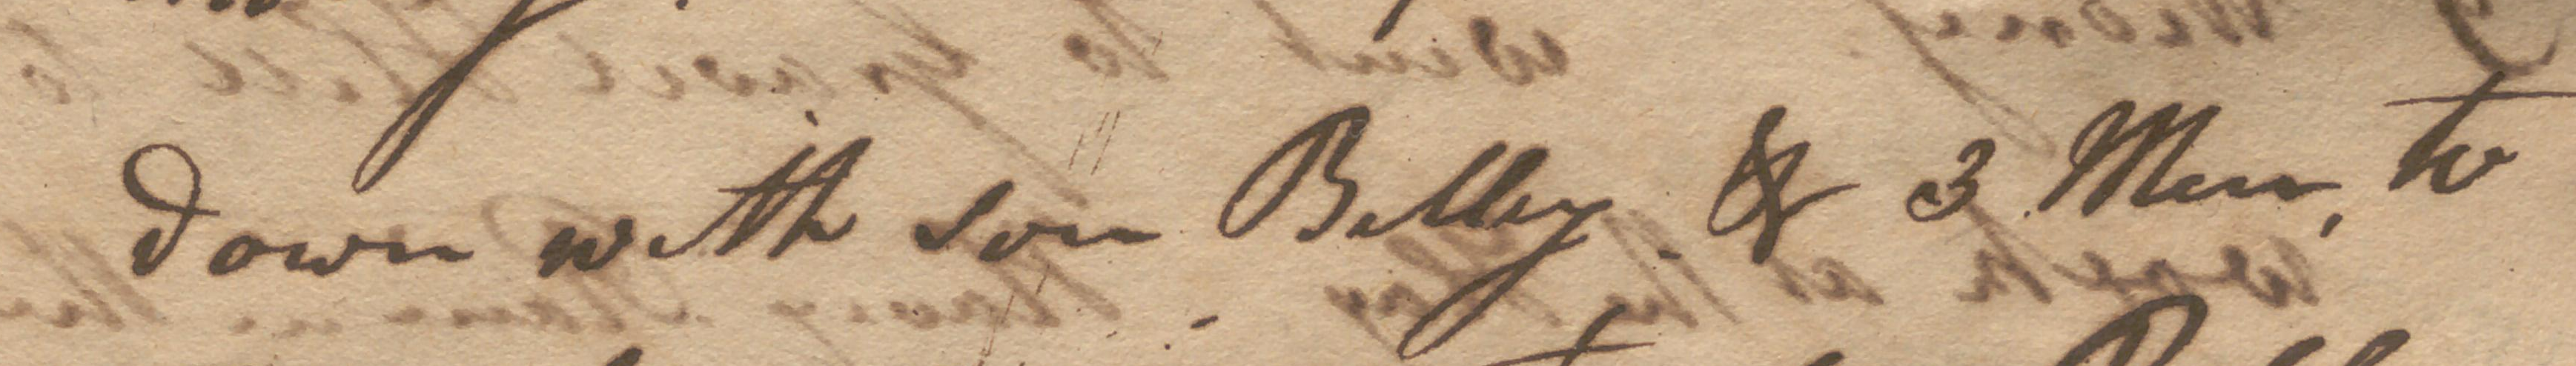down with son Billey & 8 Men to
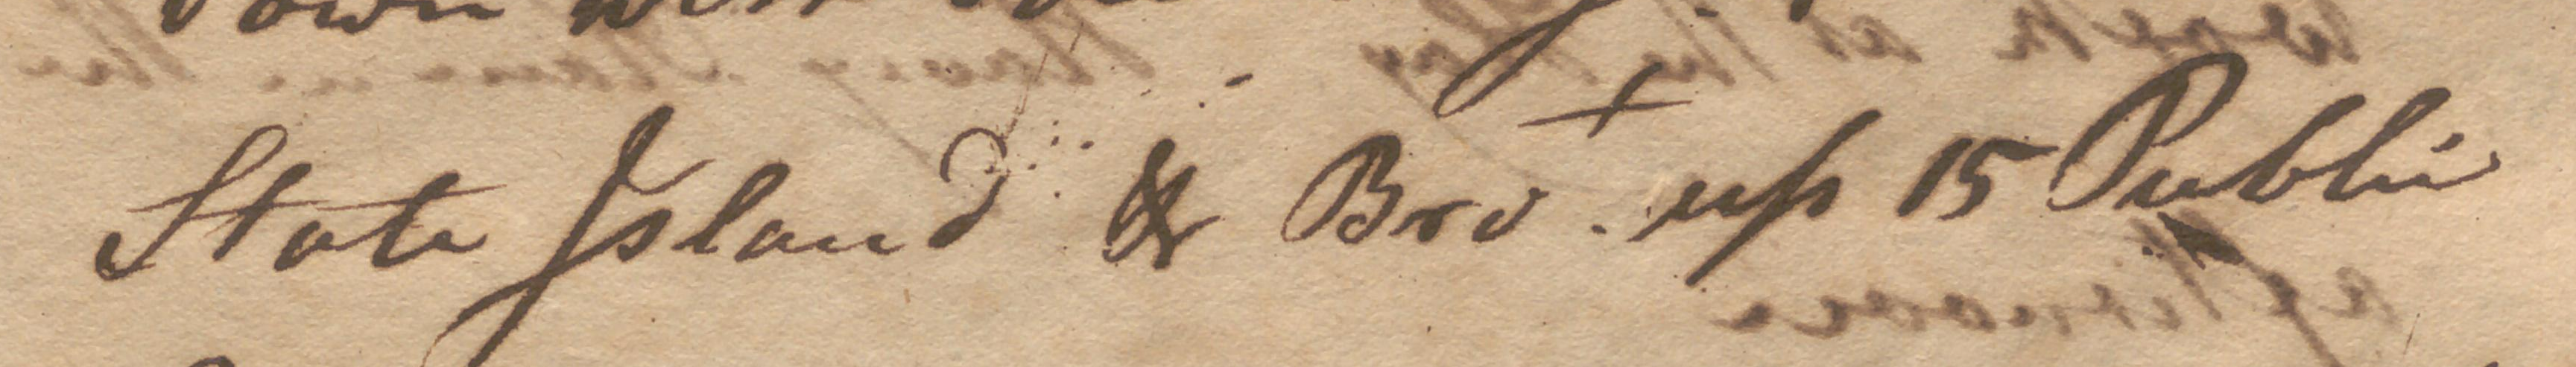State Island & Bro up 15 Public
